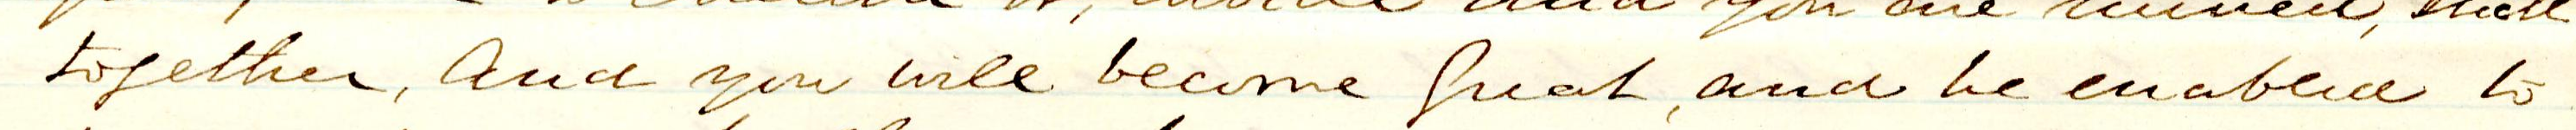together, And you will become great, and be enabled to
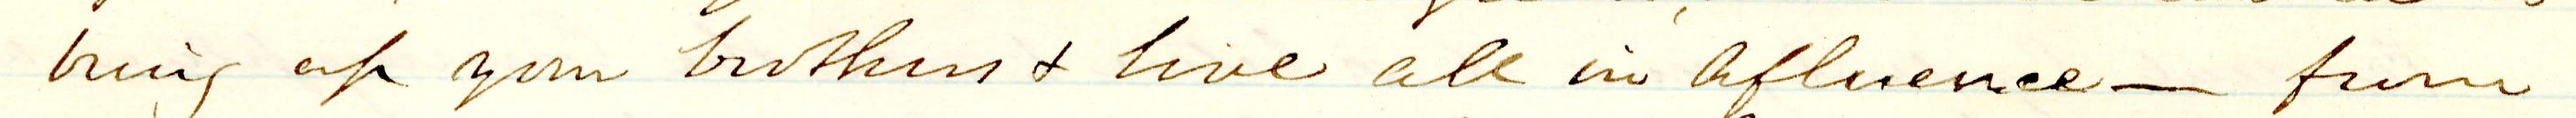bring up your brothers & live all in afluence- from
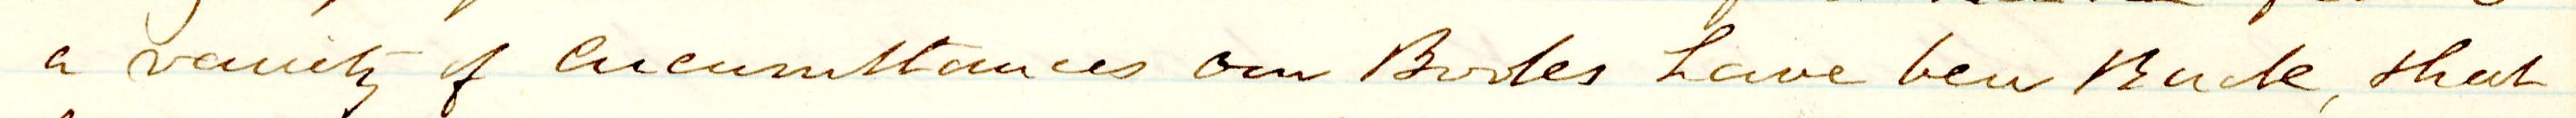a variety of Circumstances our bonds have been Bade, that
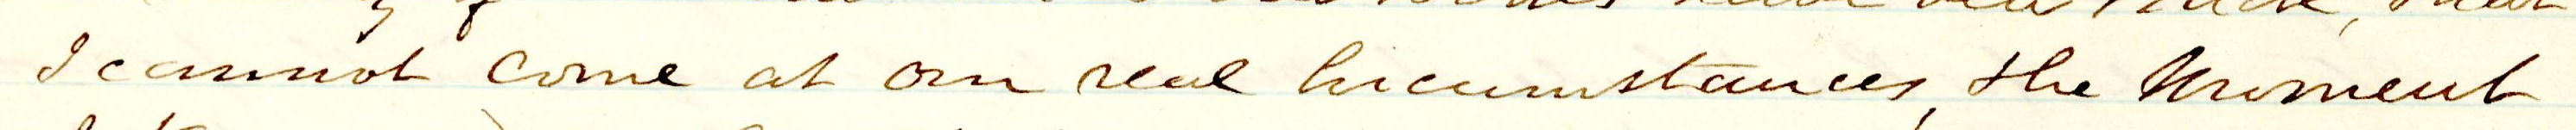I cannot come at our real Circumstances, the moment
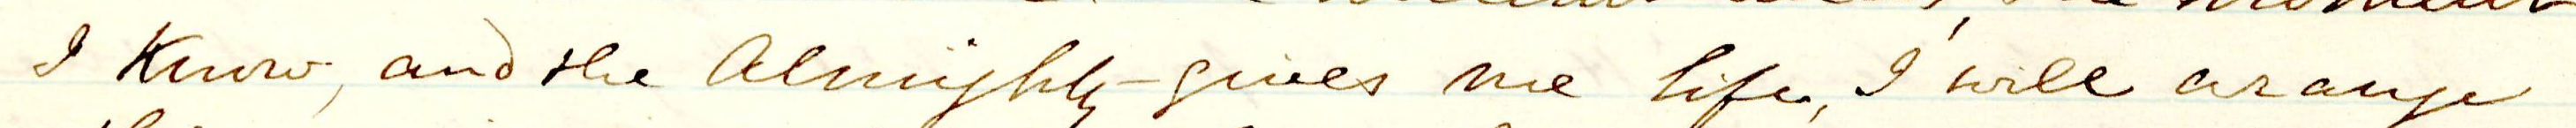I knew, and the Almighty gives me life, I wile arrange
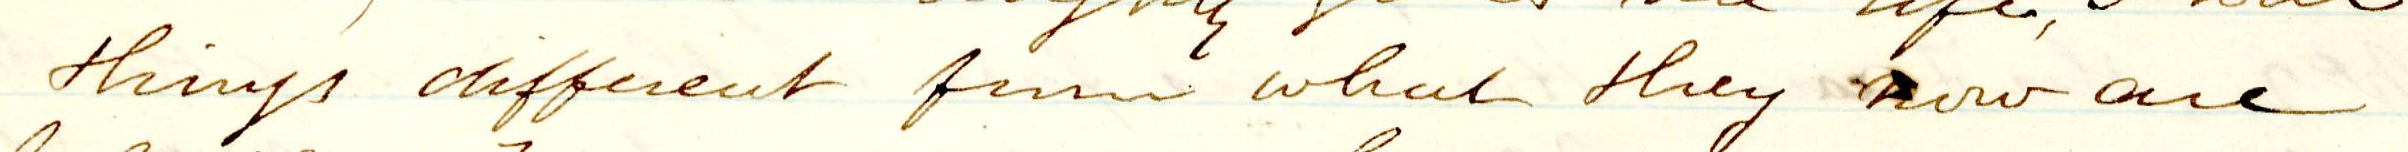things different from what they now are
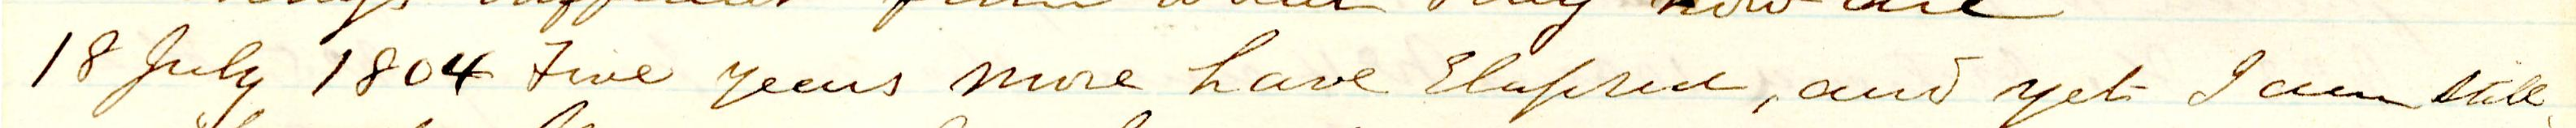18 July 1804 Five years more have Elapsed, and yet I am still
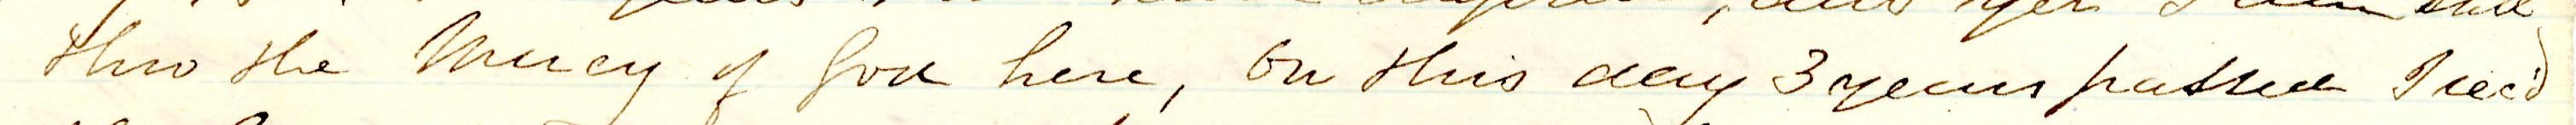thru the Mercy of God here, on this day 3 years passed I rec'd
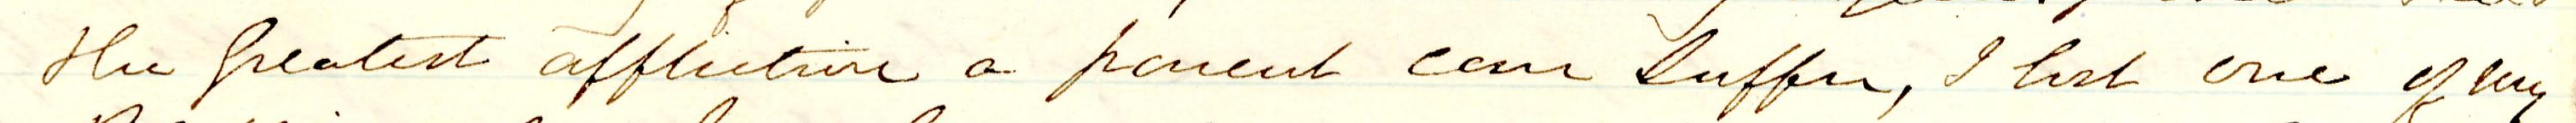the greatest afflictions a parent can suffer, I lost one of my
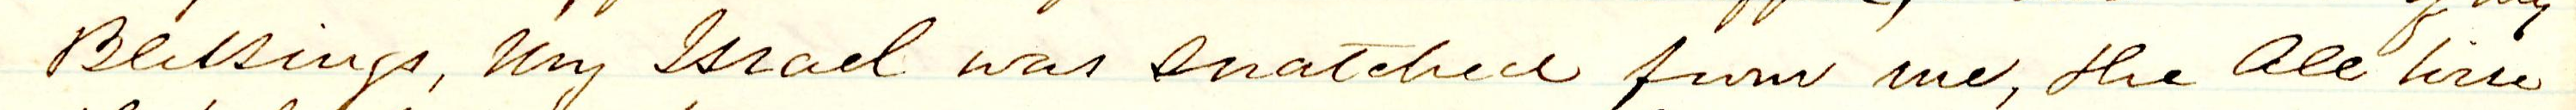Blessings, my Israel was snatched from me, the All will
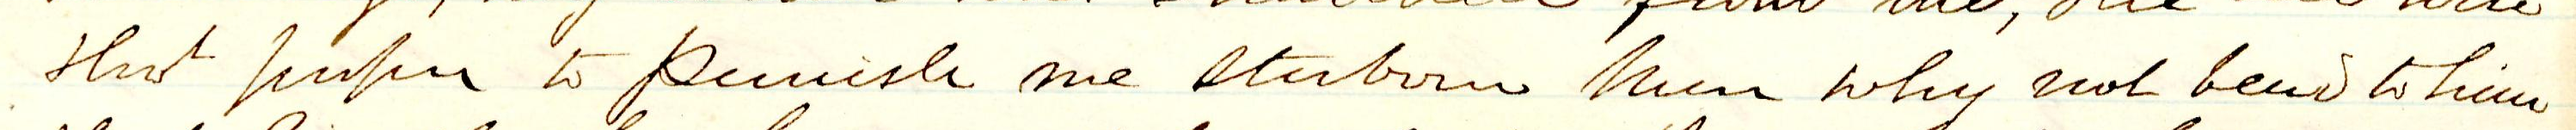that prosper to Punish me stuborn then why not send to him
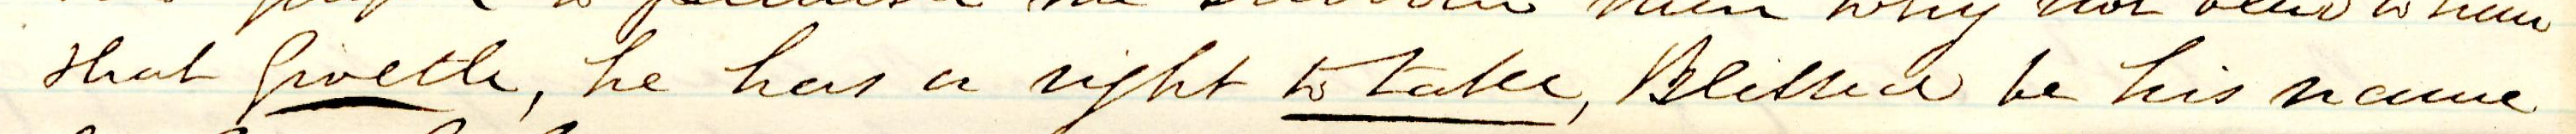that Giveth, he has a right to take, Blessed be his name
